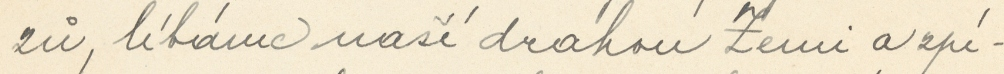zů, líbáme naší drahou Zemi a zpí-
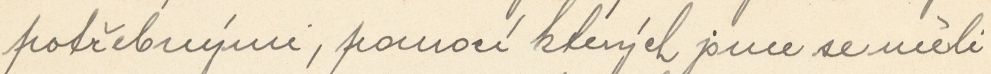potřebnými, pomocí kterých jsme se měli
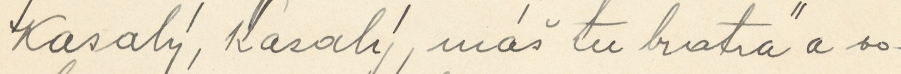Kasalý, Kasalý, máš tu bratra“ a vo-
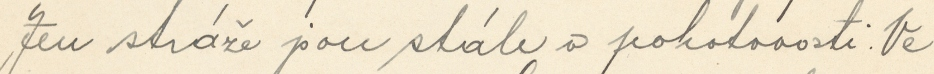Jen stráže jsou stále v pohotovosti. Ve
